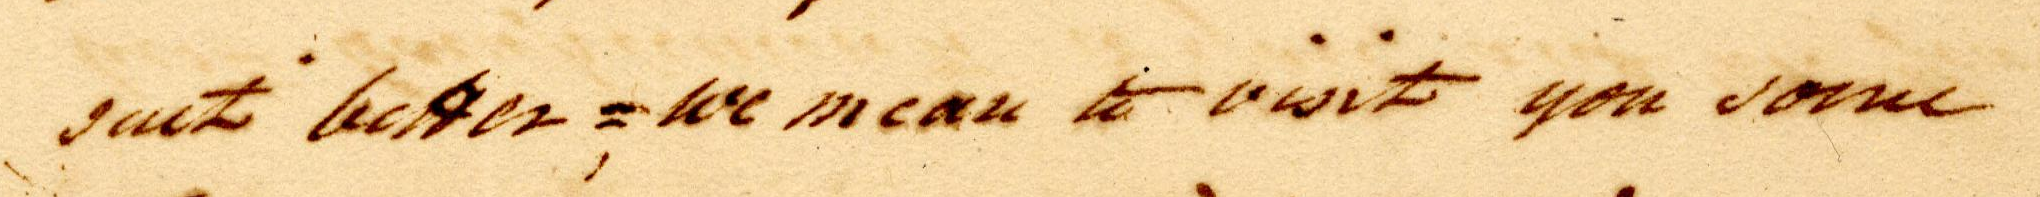suit better - We mean to visit you some
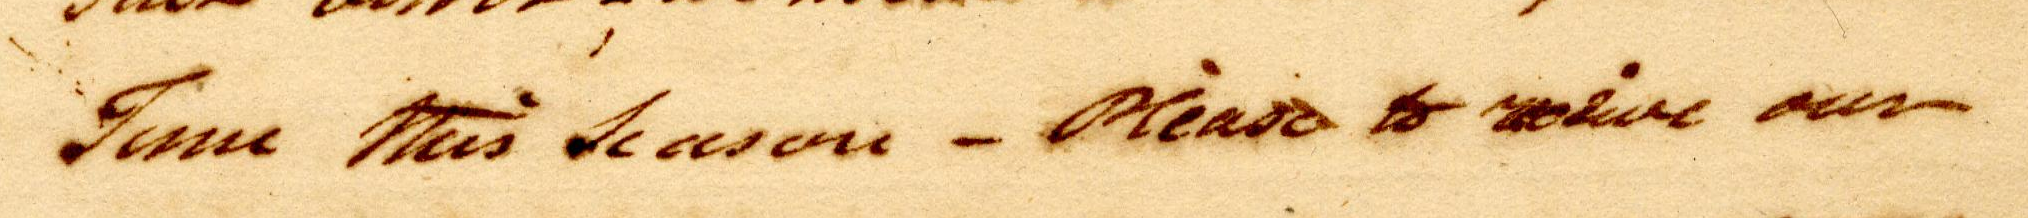Time this Season- Please to raise our
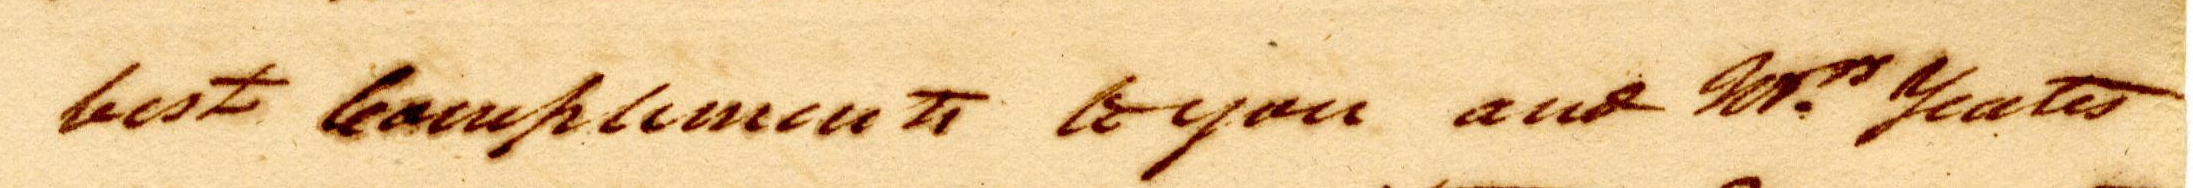best Compliments to you and M^rs. Yeates
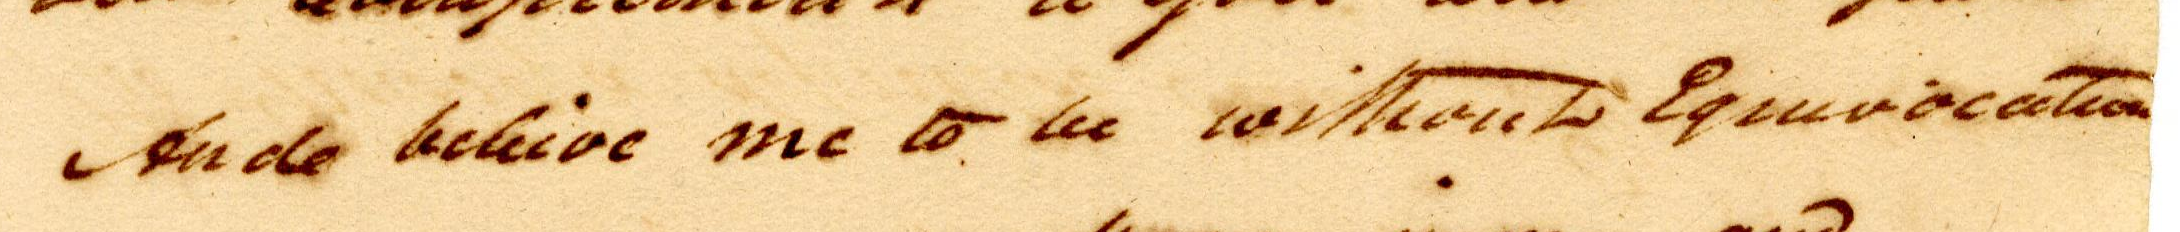Ande beleive me to be without Equivocation
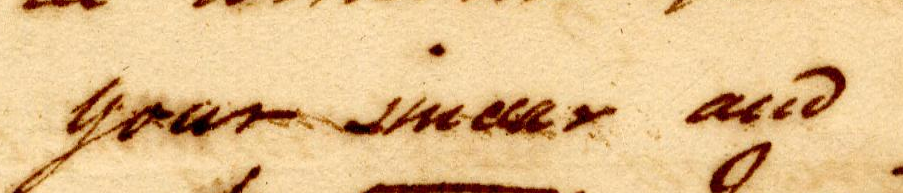your sincear and
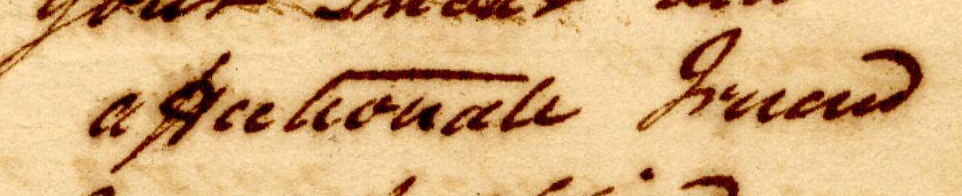affectionate Friend
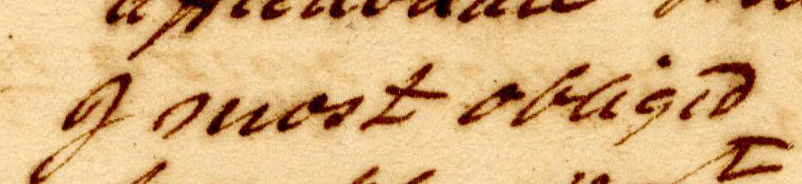& most obliged
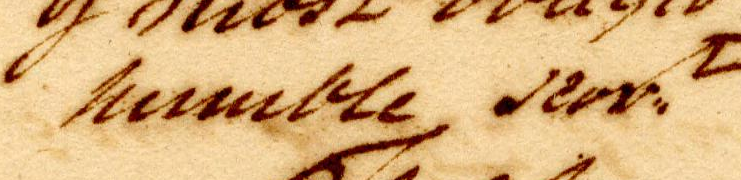humble serv^t.
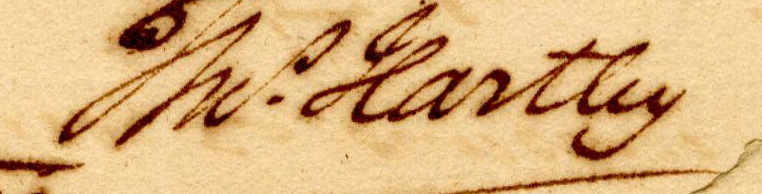Tho^s Hartley
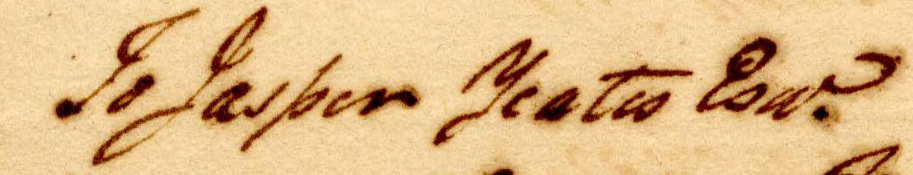To Jasper Yeates Esq^r.
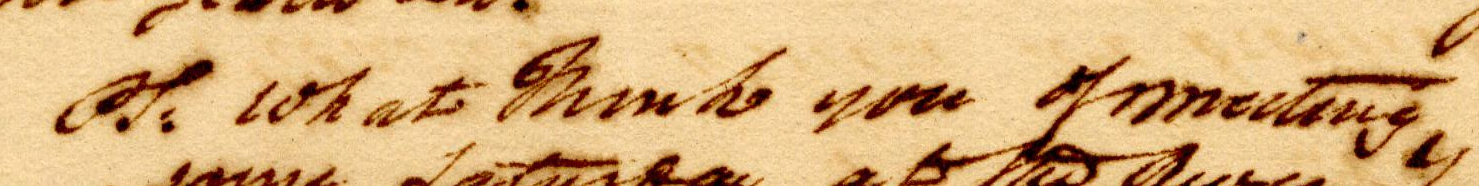PS: what Think you of meeting
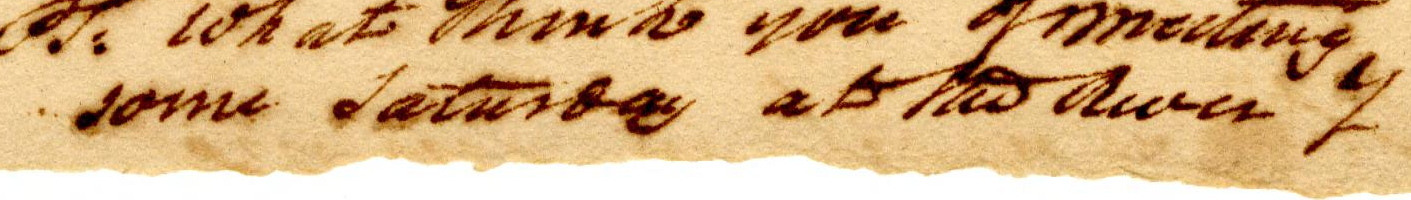some Saturday at the River?
